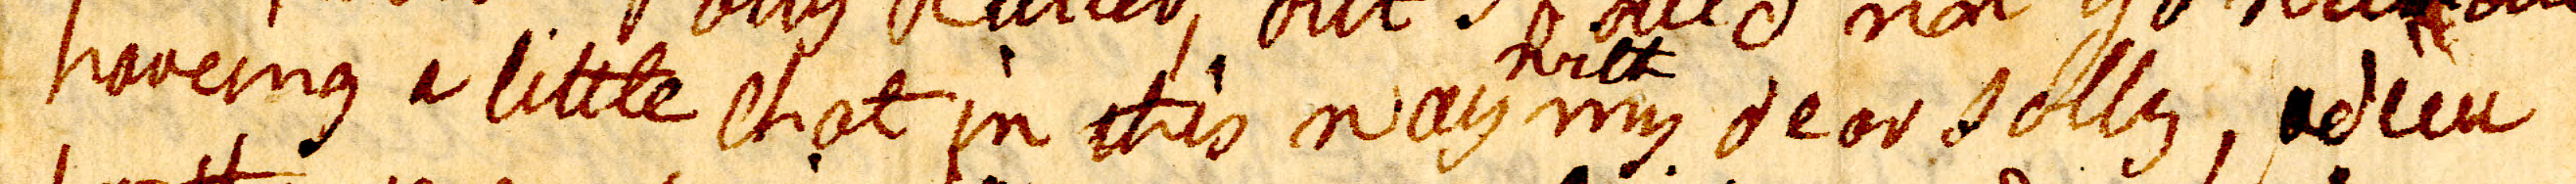haveing a little chat in this way my dear sally, adieu
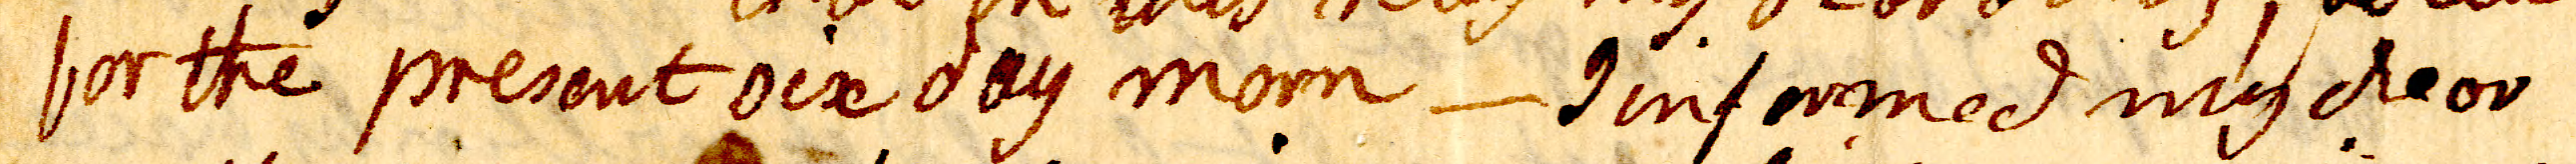for the present six day morn- I informed my dear
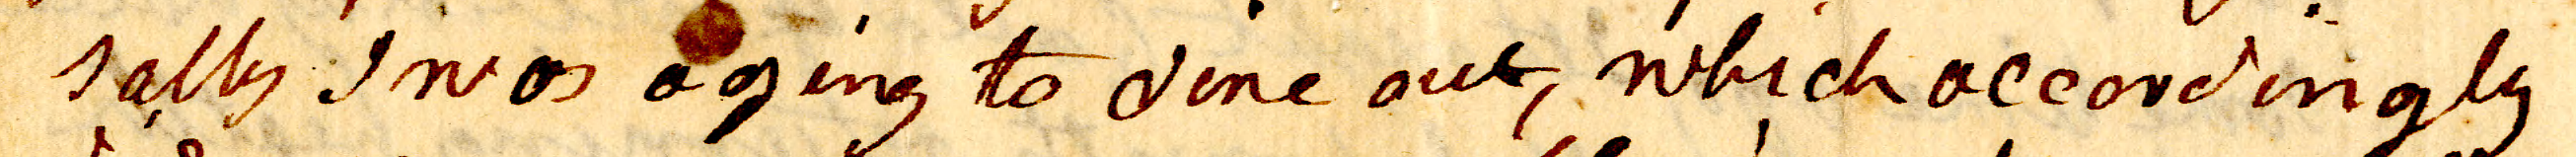sally I was a going to dine out, which accordingly
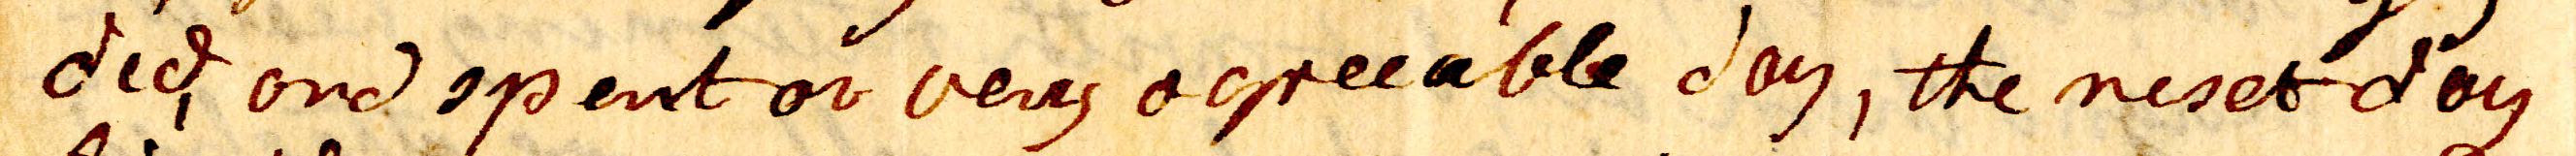did, and spent a very agreeable day, the next day
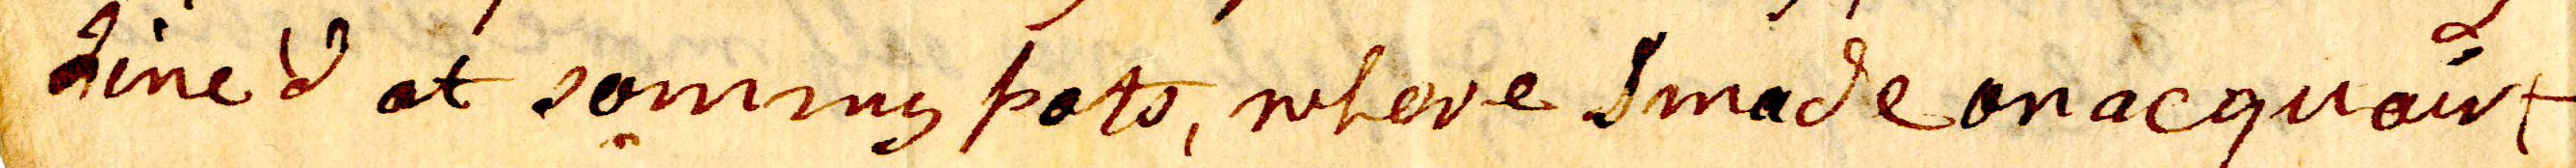dined at sammy pots, where I made on acquaint
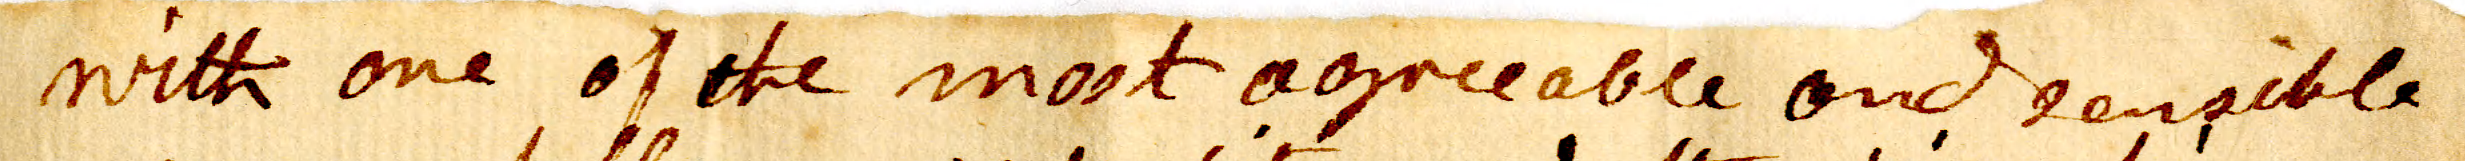with one of the most agreeable and sensible
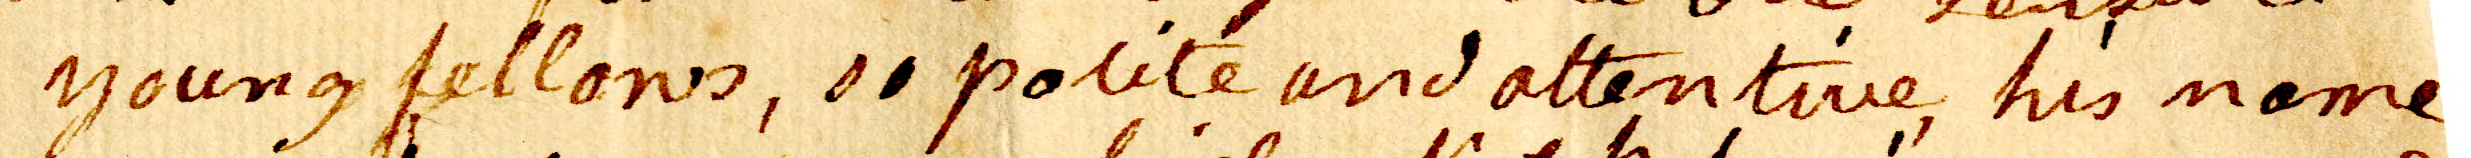young fellows, so polite and attentive, his name
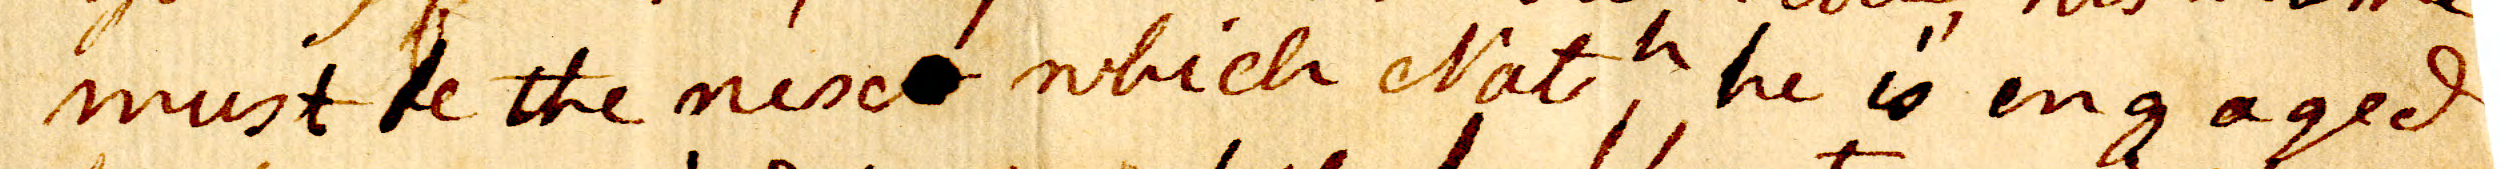must be the nex[_] which Nat^h he is engaged
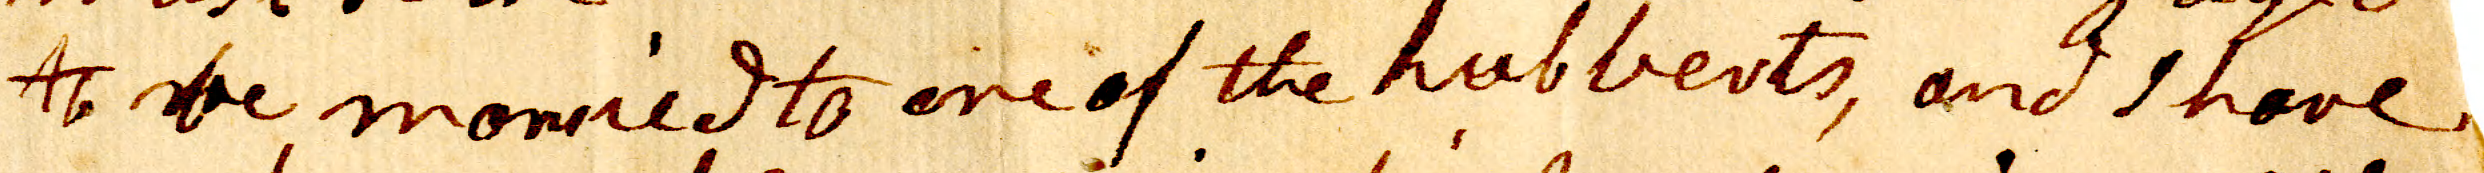to be married to one of the hubberts, and I have
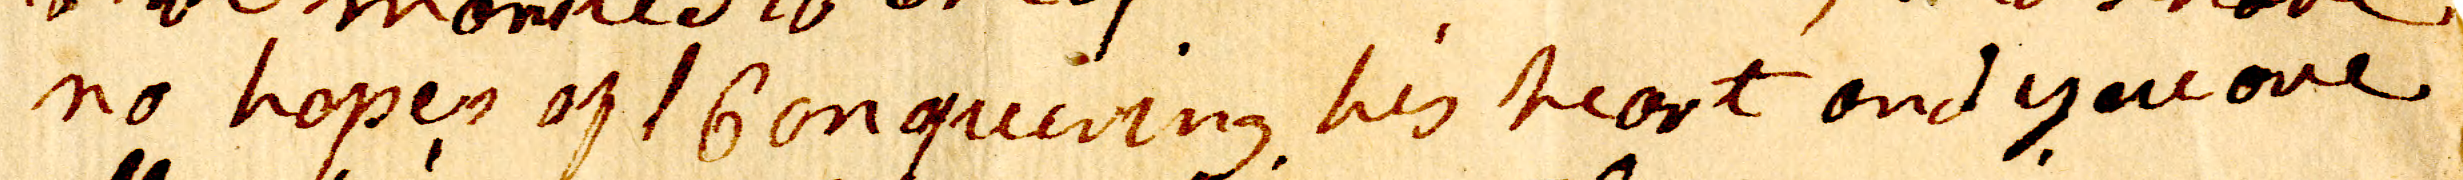no hopes of conquering his heart and you are
